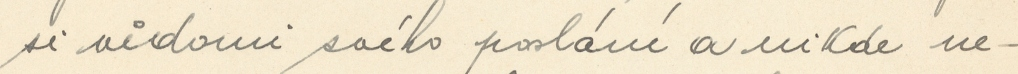si vědomi svého poslání a nikde ne-
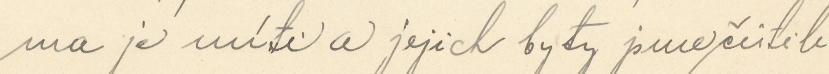ma je míti a jejich byty jsme čistili
